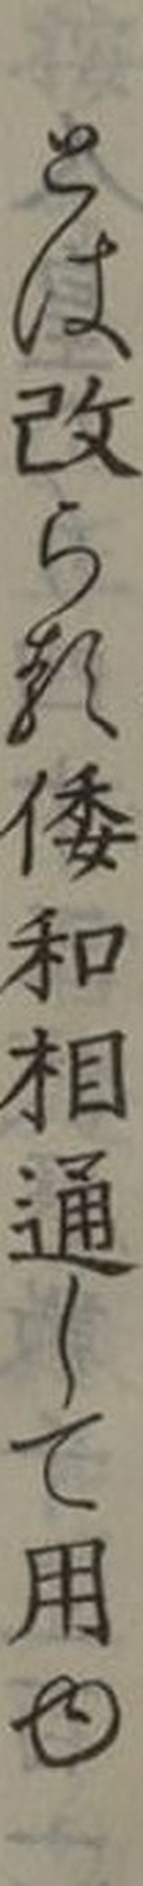とは改らる倭和相通して用ゆ
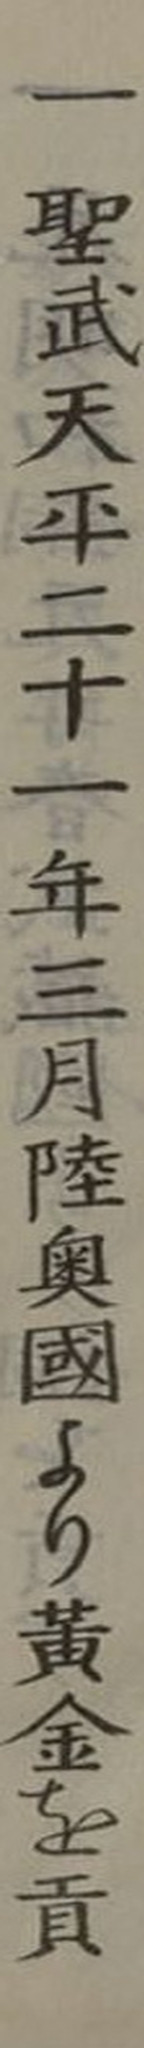一聖武天平二十一年三月陸奥國より黄金を貢
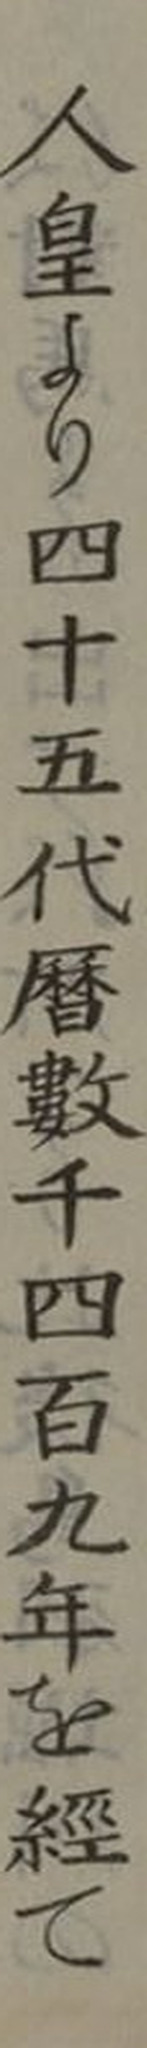人皇より四十五代暦數千四百九年を經て
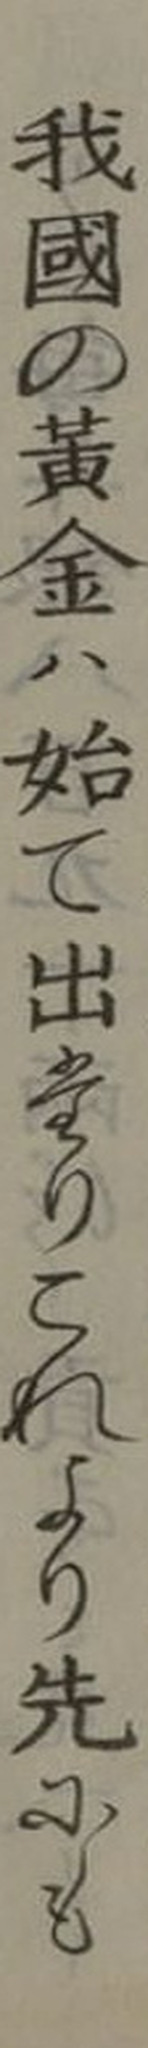我國の黃金は始て出たりこれより先にも
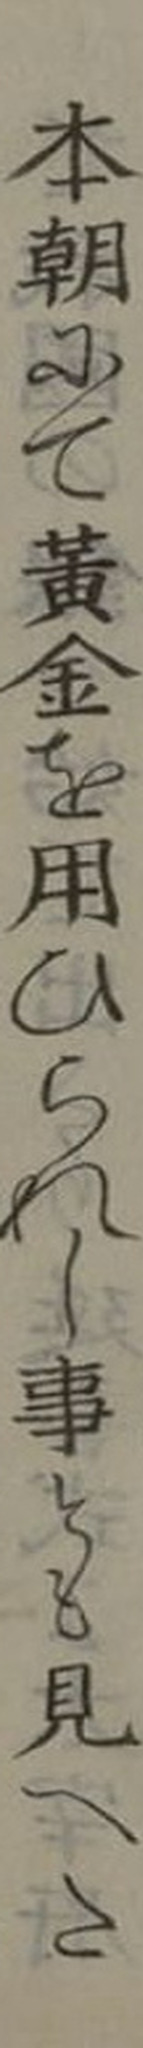本朝にて黃金を用ひられし事とも見へた
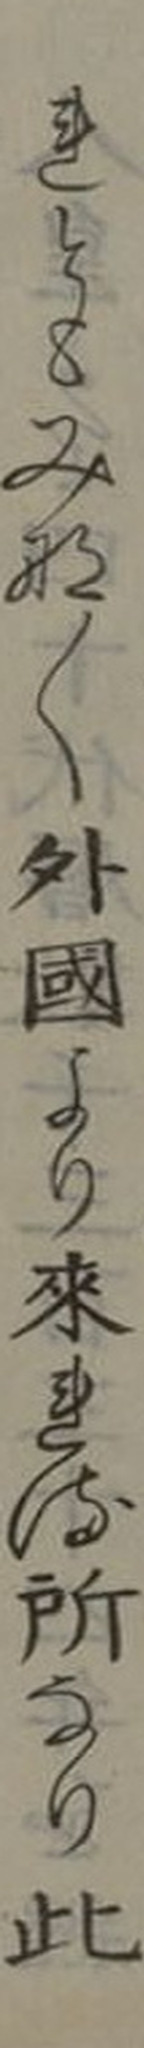れともみな〳〵外國より來れる所なり此
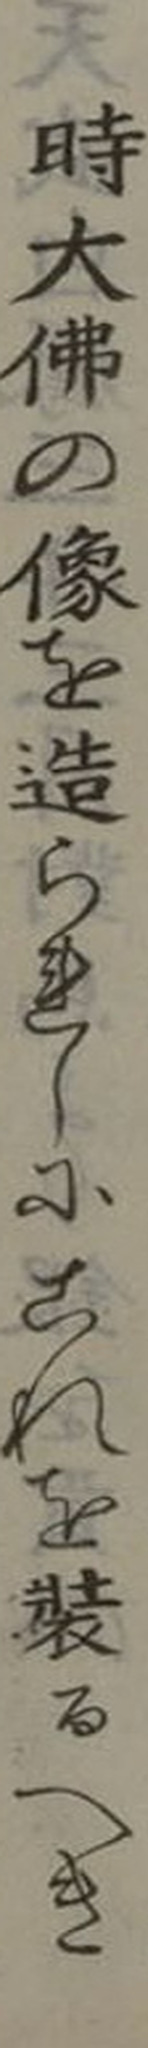時大佛の像を造られしにこれを裝るへき
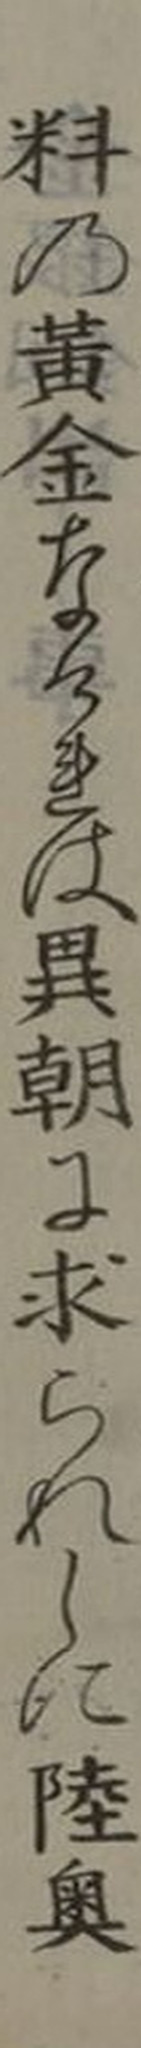料の黃金なけれは異朝に求られしに陸奥
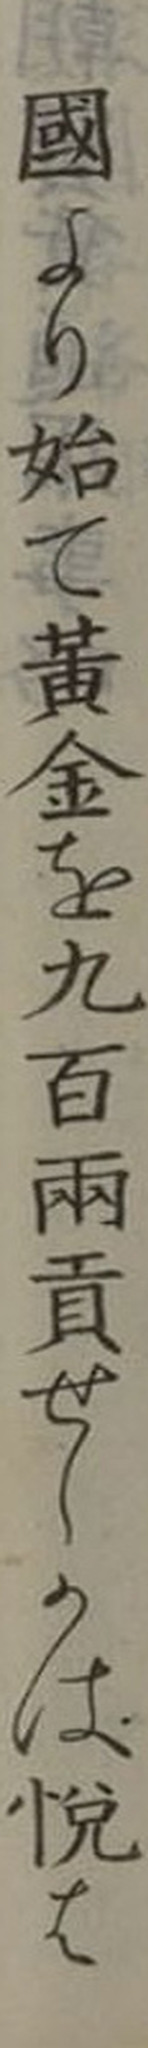國より始て黃金を九百兩貢せしかは悦は
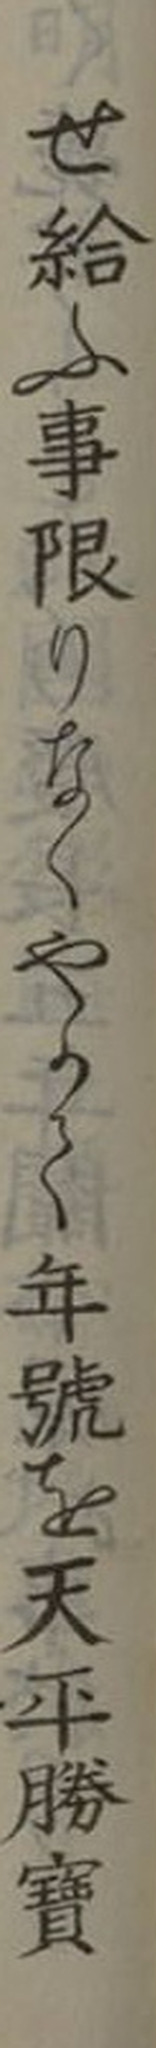せ給ふ事限りなくやかて年號を天平勝寶
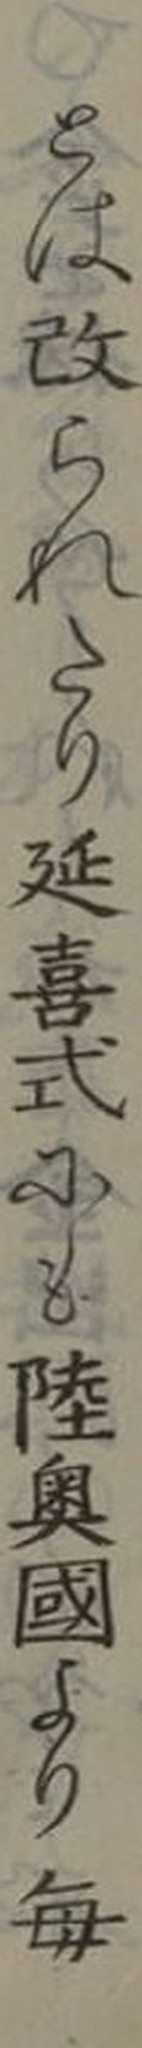とは改られたり延喜式にも陸與國より毎
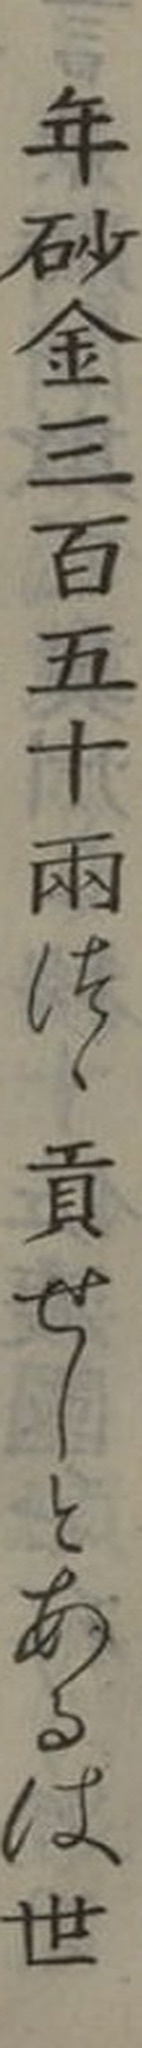年砂金三百五十兩つゝ貢せしとあるは世
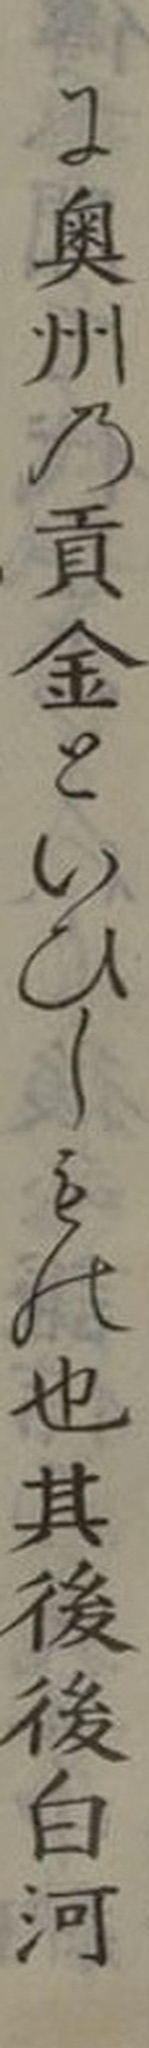に奧州の貢金といひしもの也其後後白河
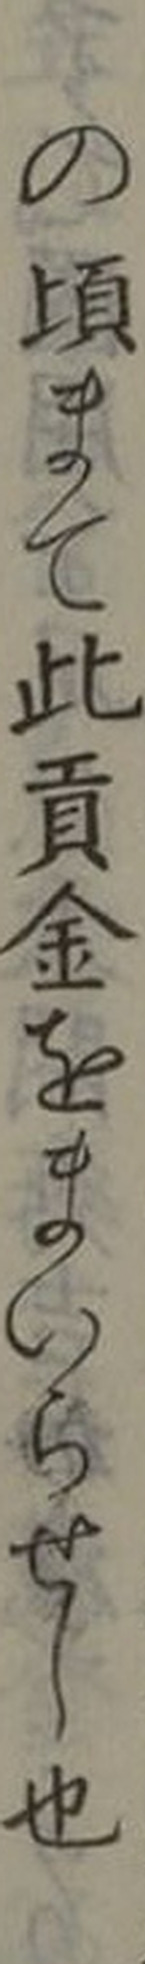の項まて此貢金をまいらせし也
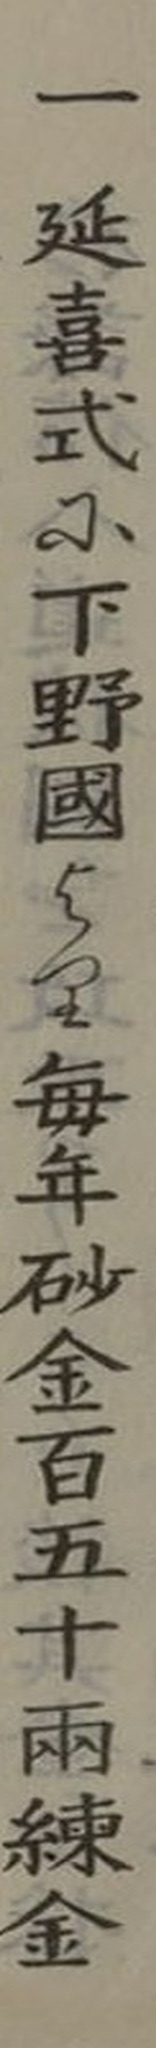一延喜式に下野國より毎年砂金百五十兩練金
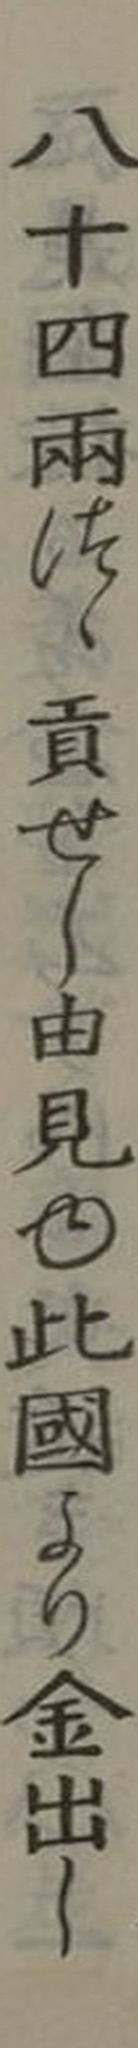八十四兩つゝ貢せし由見ゆ此國より金出し
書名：骨董録
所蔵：University of the Ryukyus Library
